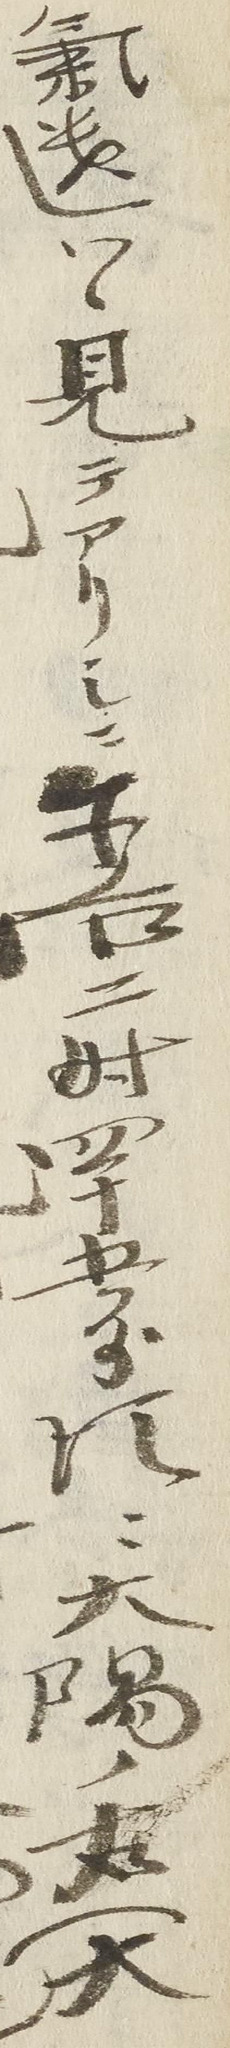気遣ツゝ見テアリシニ午后二時四十五分頃ニ大陽ノ右（大
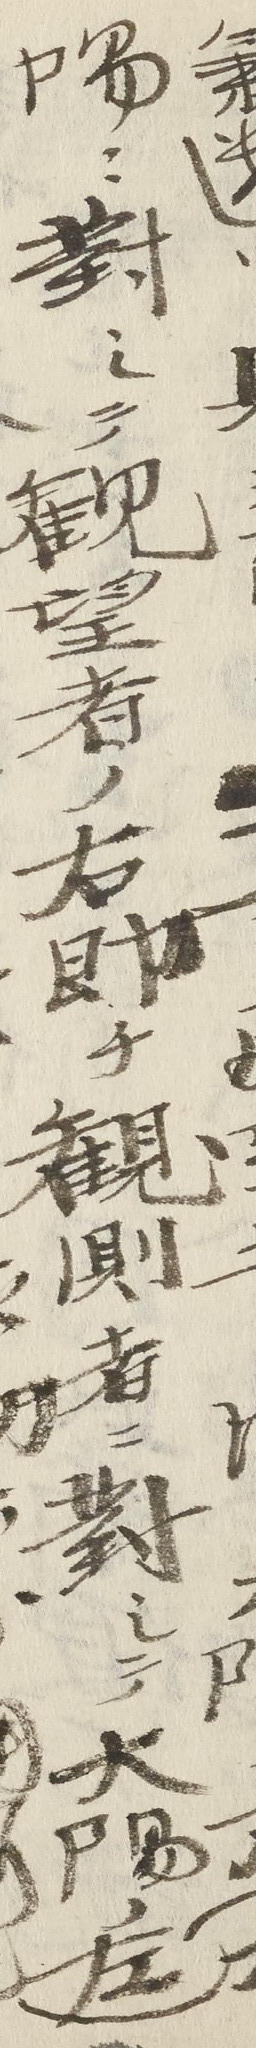陽ニ対シテ観望者ノ右即チ観測者ニ対シテ大陽ノ左）
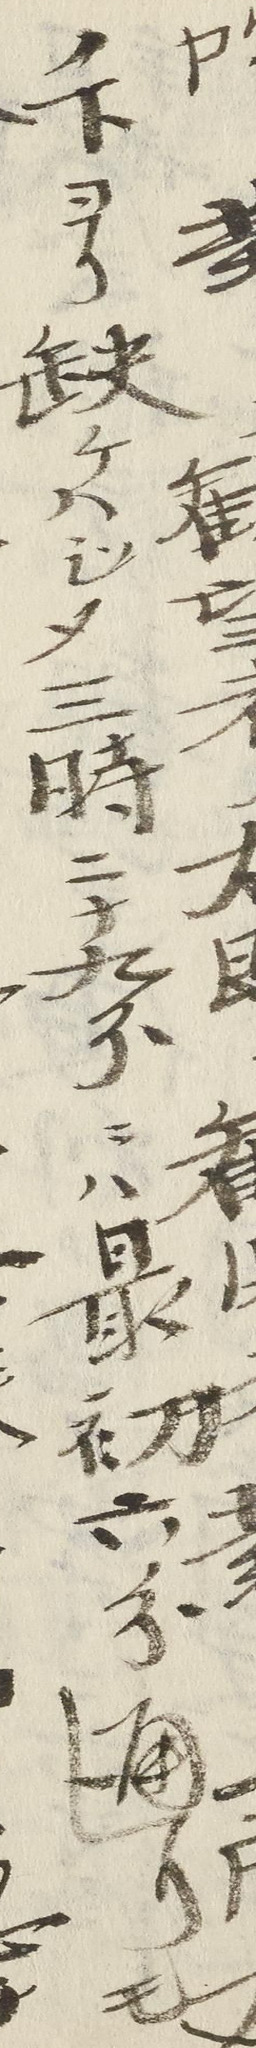ノ下ヨリ欠ヶハジメ三時二十九分ニハ最初六分通リモ
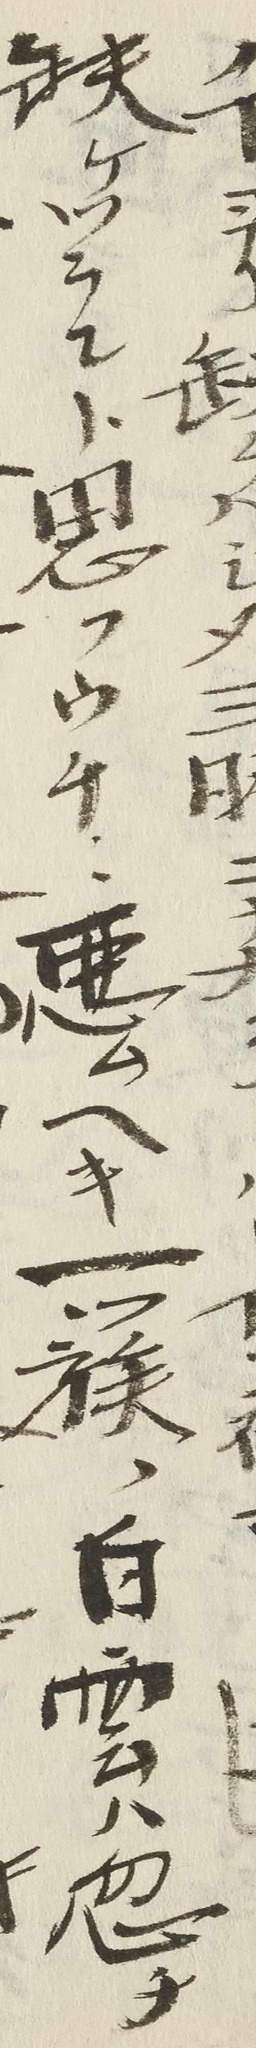欠ケツラント思フウチ悪ムヘキ一ツ族ノ白雲ハ忽チ
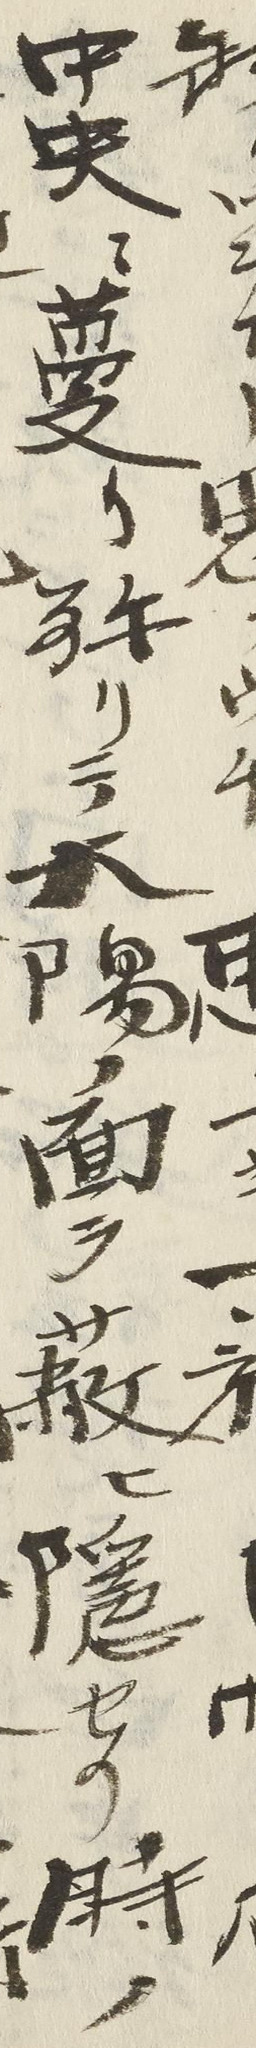中央ニ蔓リ残？リテ大陽ノ面ヲ蔽ヒ隠セリ時ノ
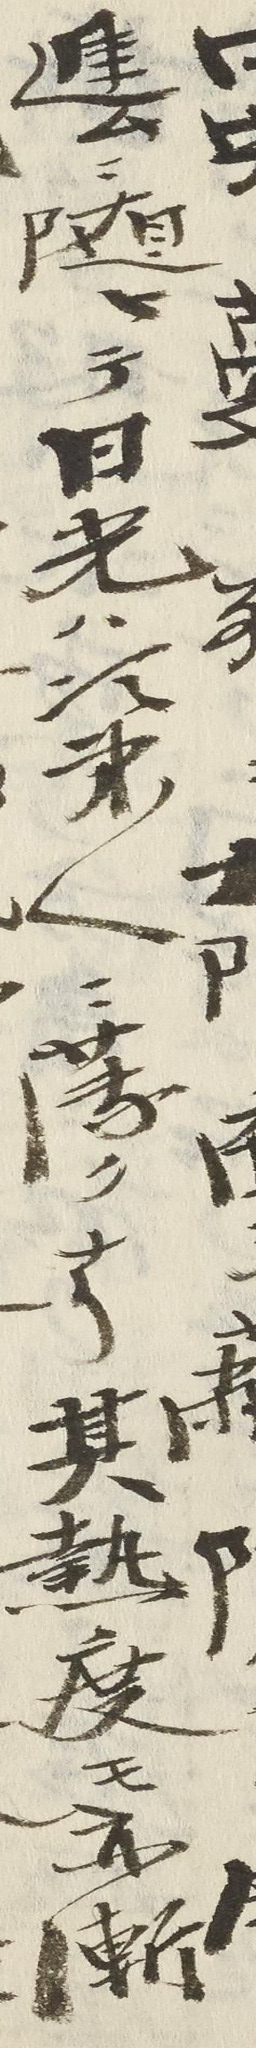進ムニ随ヒテ日光ハ次第〳〵ニ薄クナリ其熱度モ又漸
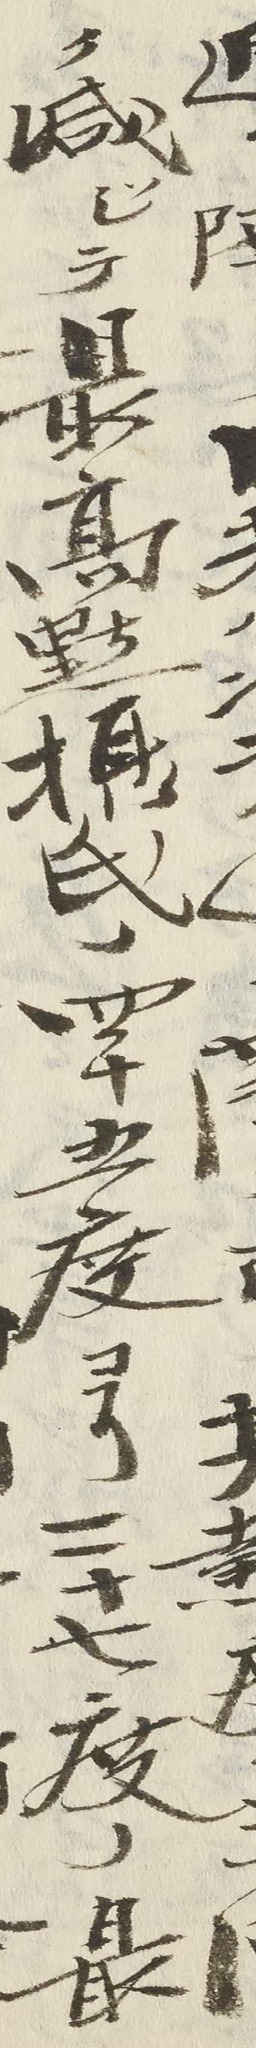ク減ジテ最高点摂氏ノ四十五度ヨリ二十七度ノ最
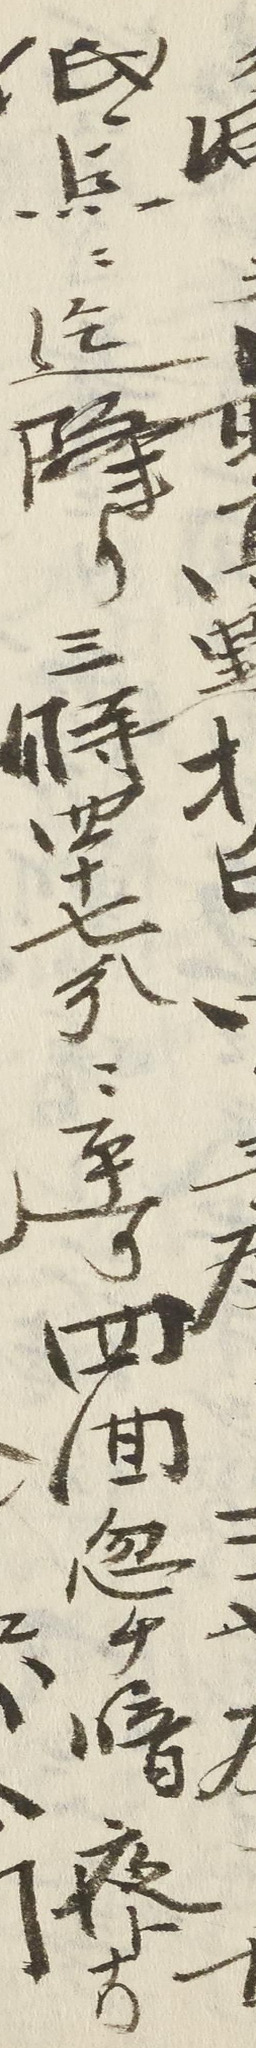低点ニ迄降リ三時四十七分ニ至リ四面忽チ暗夜トナリ
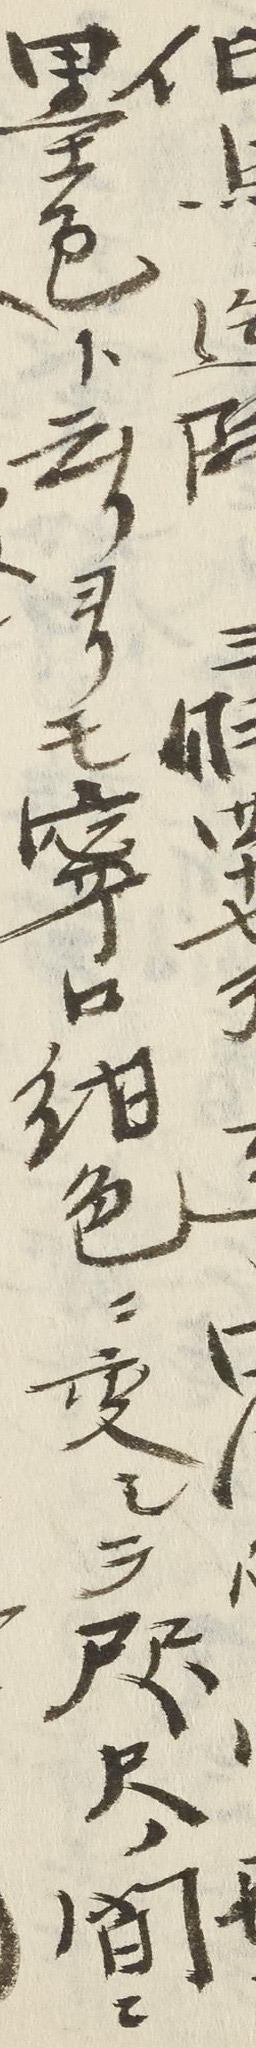墨色ト云フヨリモ寧ロ紺色ニ変シテ咫尺ノ間ニ
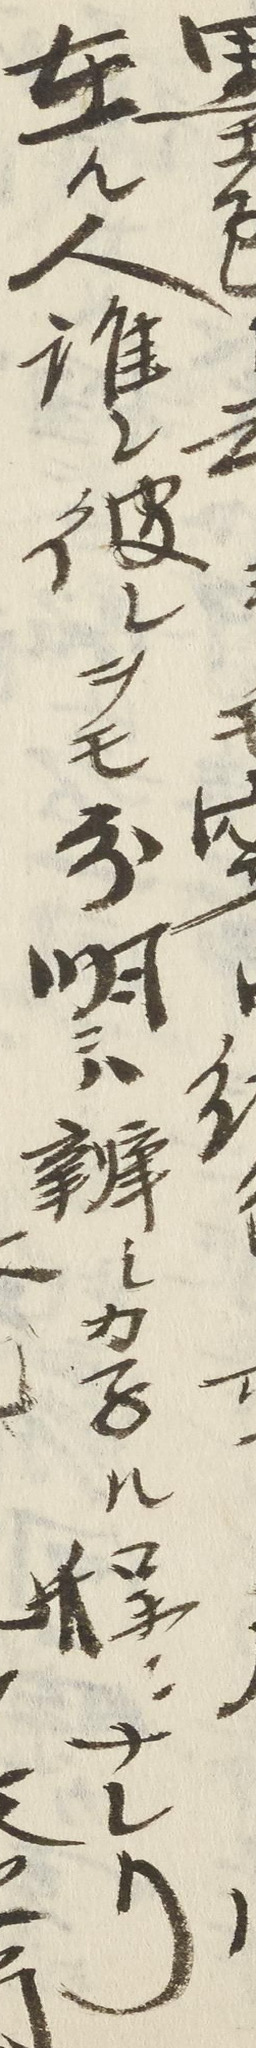在ル人誰レ彼レヲモ分明ニハ弁シカネル程ニナレリ
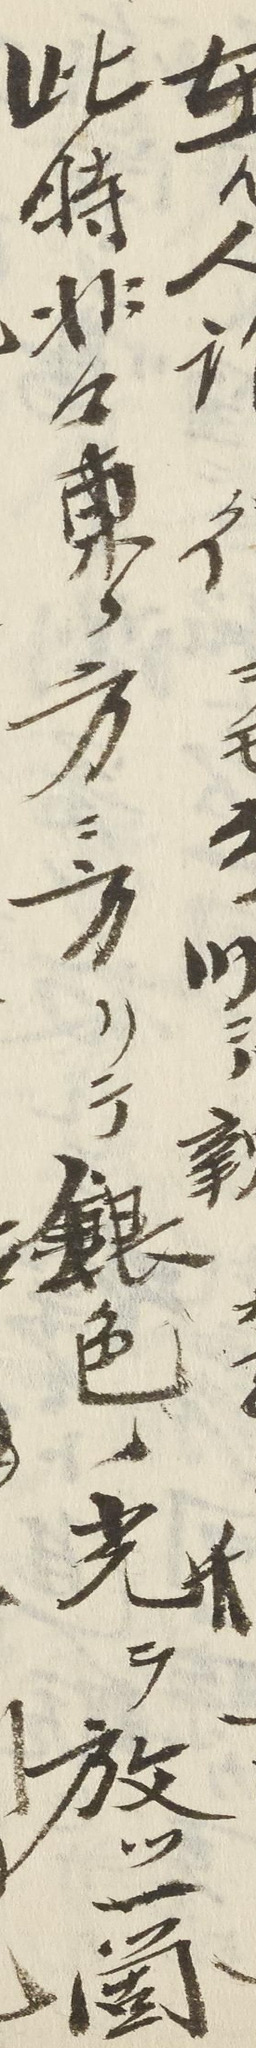此時北々東ノ方ニ方リテ銀色ノ光ヲ放ツ一箇
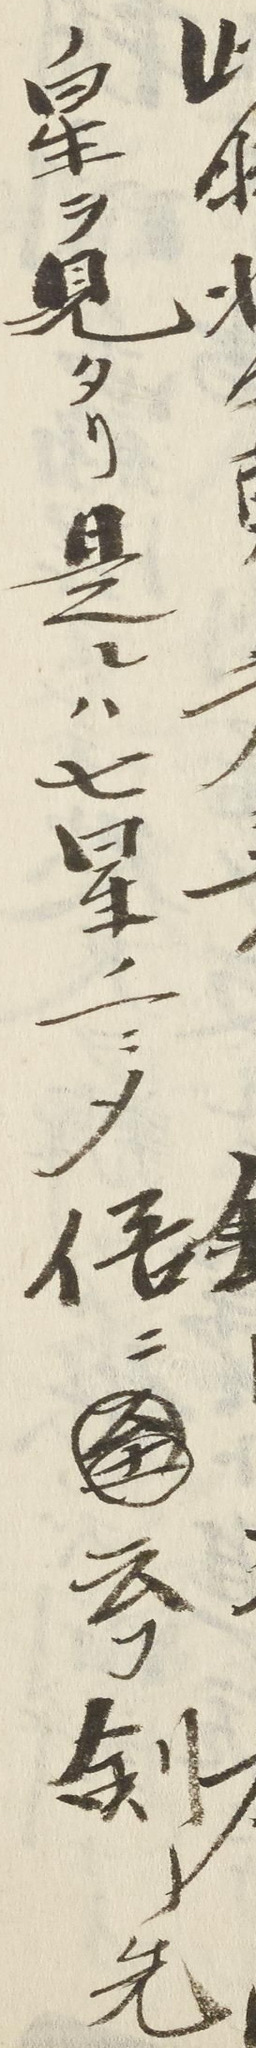ノ星ヲ見タリ是レハ七星ノ一ニシテ俗ニ云フ剣ノ先
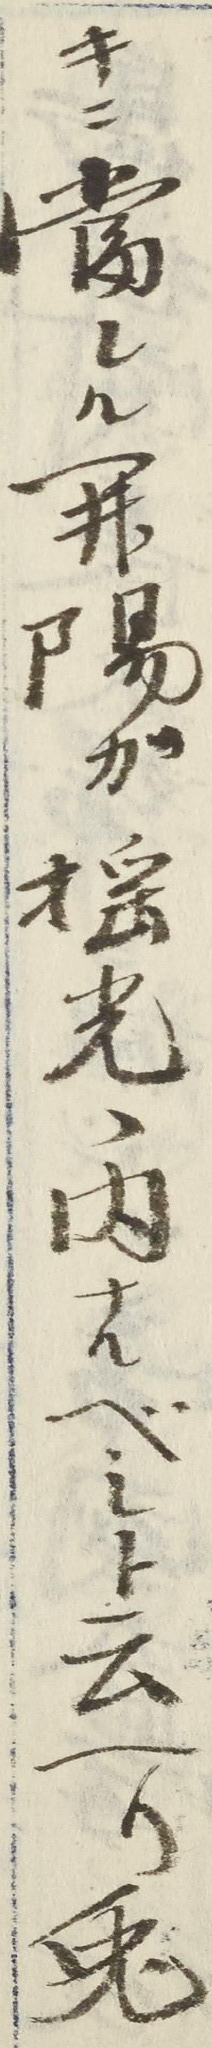キニ当レル開陽ガ揺光ノ内ナルベシト云ヘリ兎
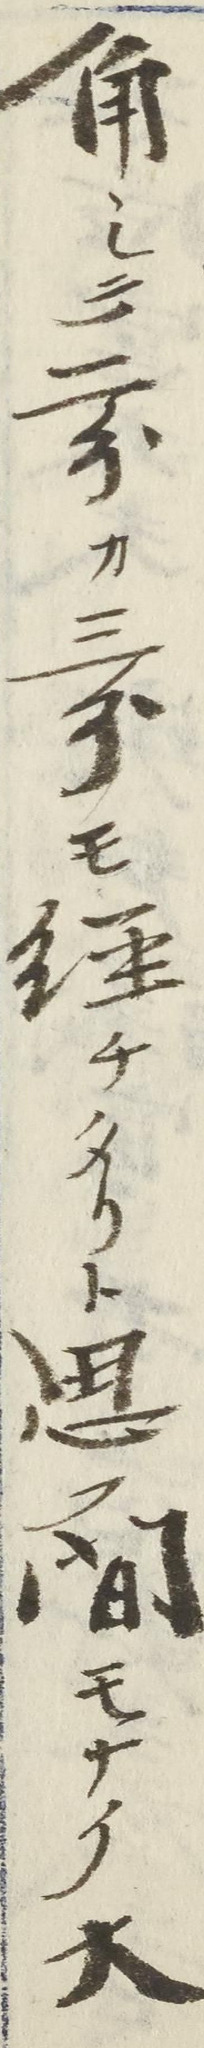角シテ二分カ三分モ経チタリト思フ間モナク大
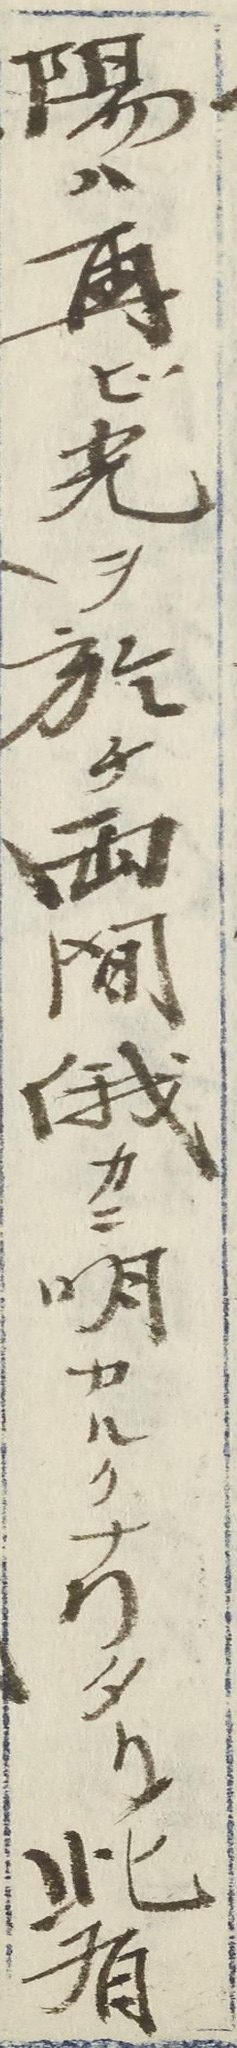陽ハ再ビ光ヲ放チ両間俄カニ明カルクナリタリ此有
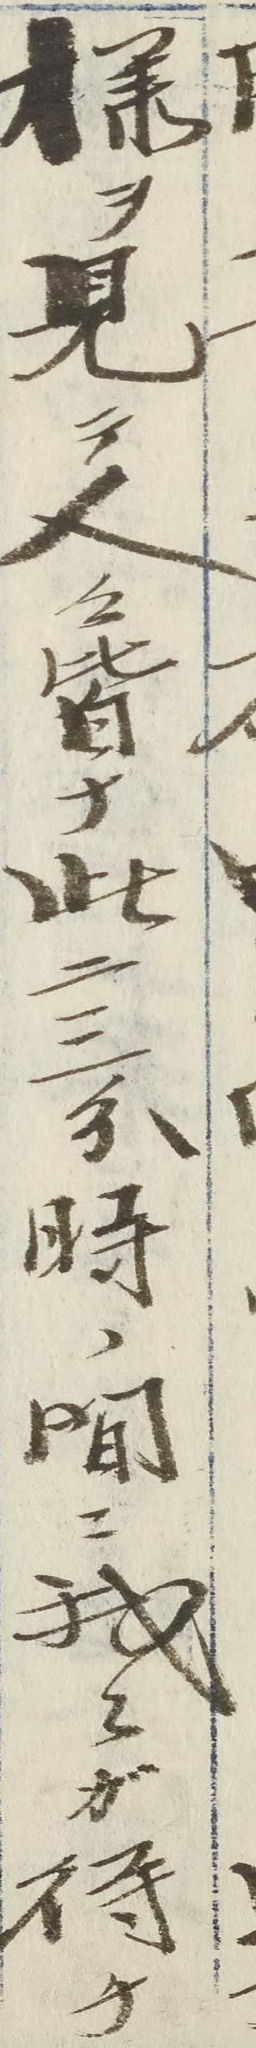様ヲ見テ人々皆ナ此二三分時ノ間ニ我々ガ待チ
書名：日蝕録　全
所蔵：東京大学地震研究所図書室 Earthquake Research Institute Library, The University of Tokyo, JAPAN
